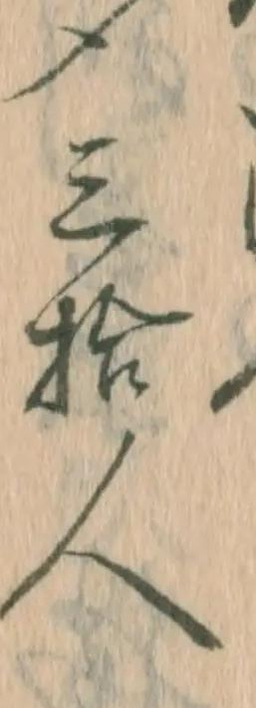〆三拾人
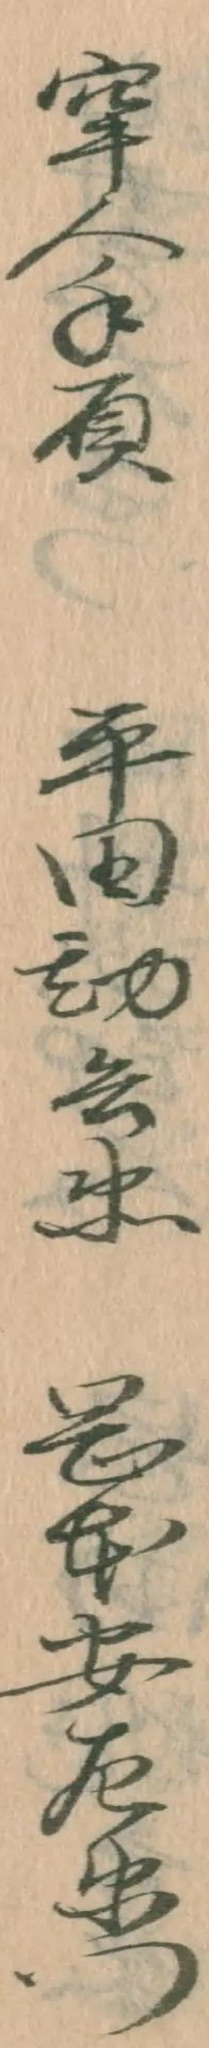牢人手負平田勘兵衛岡本安左衛門
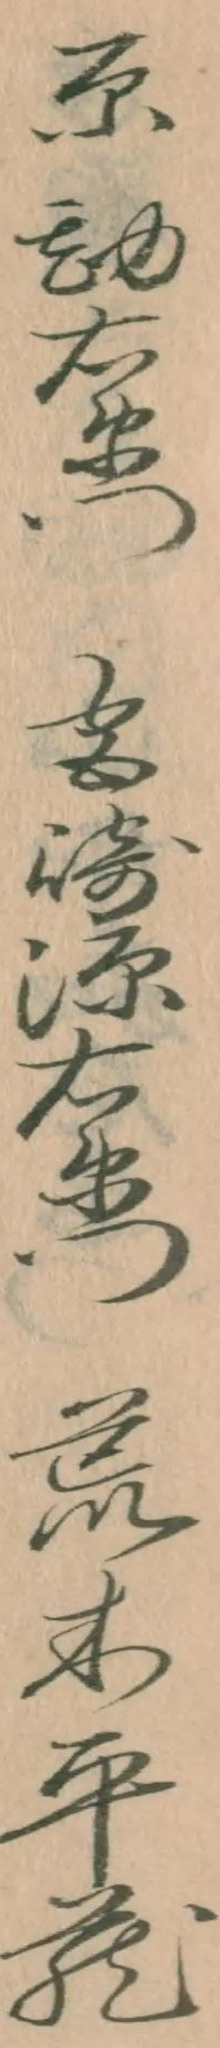原勘右衛門宮崎源右衛門荒木平蔵
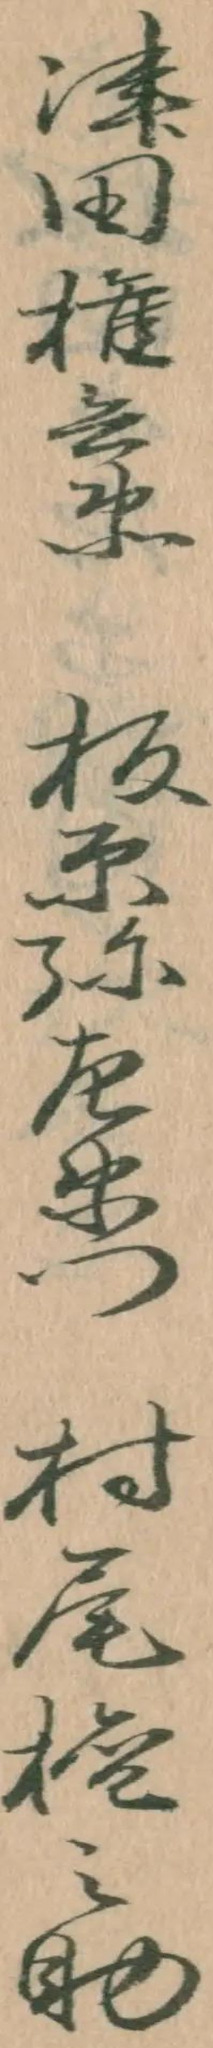津田権兵衛板原弥左衛門村尾権之助
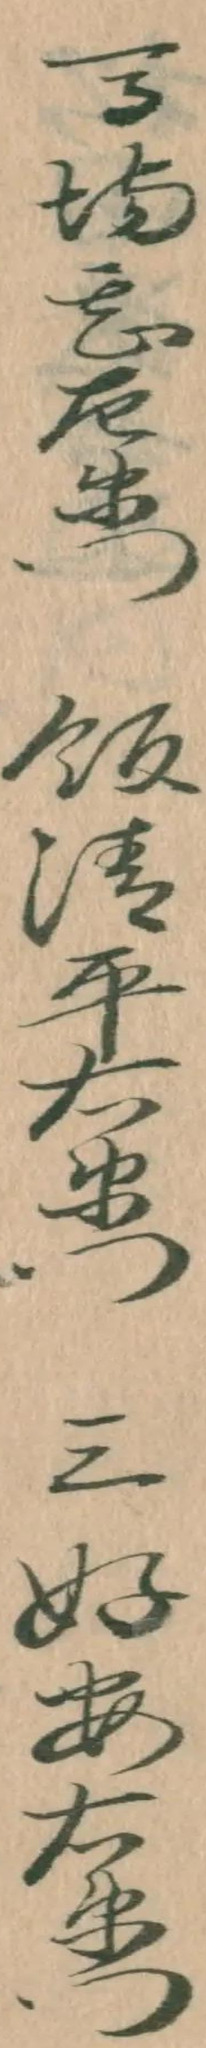馬場甚左衛門飯清平右衛門三好安右衛門
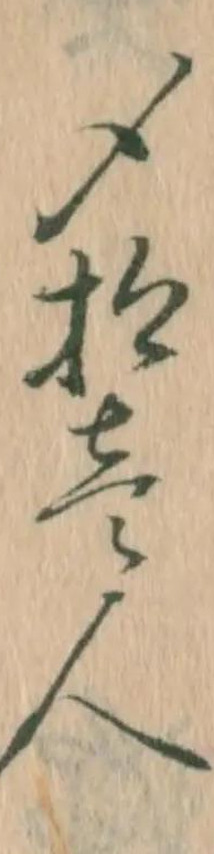〆拾壱人
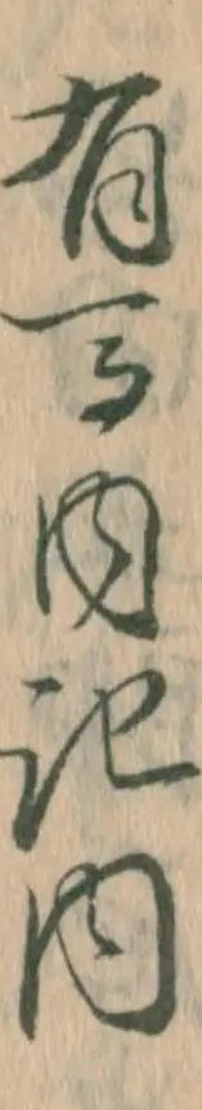有馬内記内
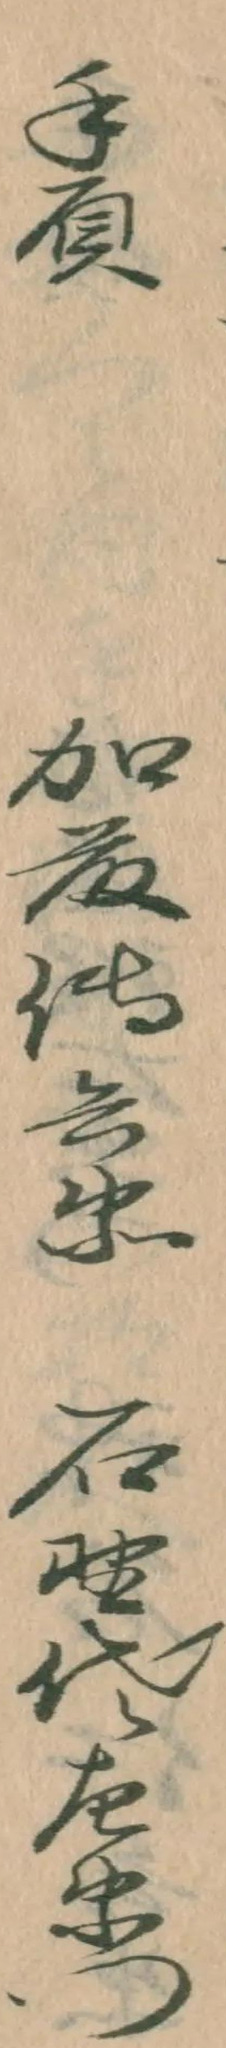手負加藤伝兵衛石野佐左衛門
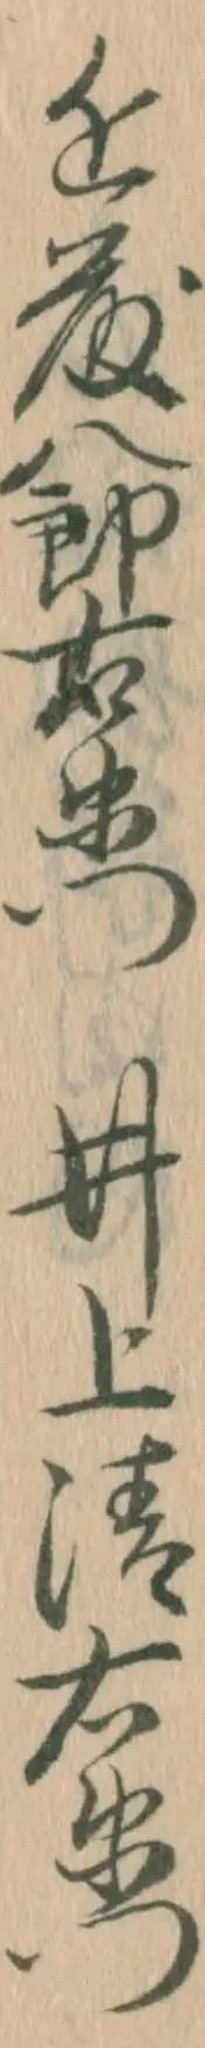近藤八郎右衛門井上清右衛門
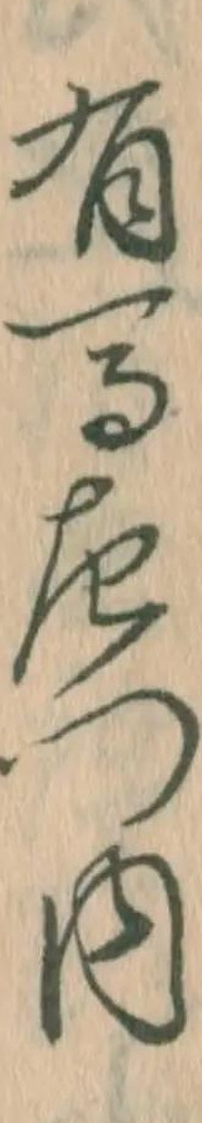有馬左門内
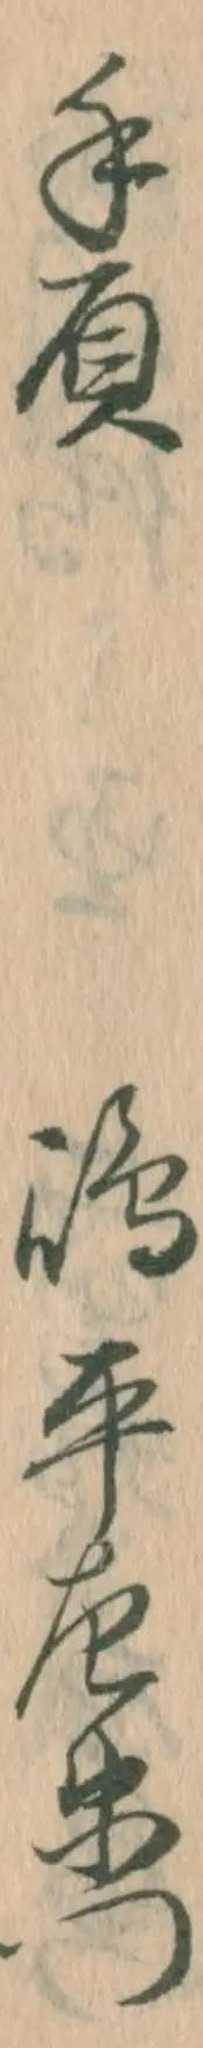手負島平左衛門
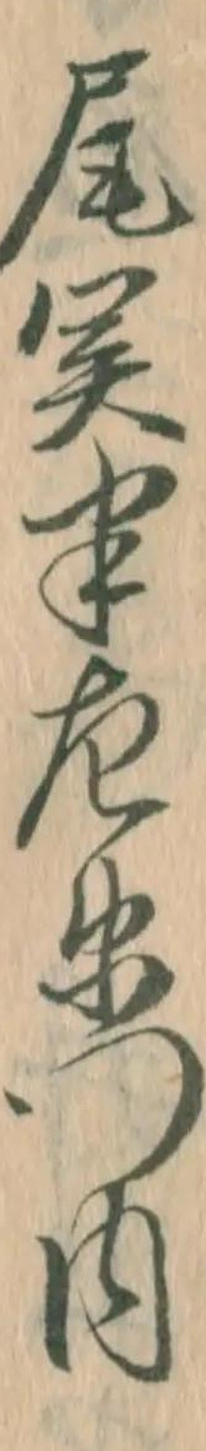尾関半左衛門内

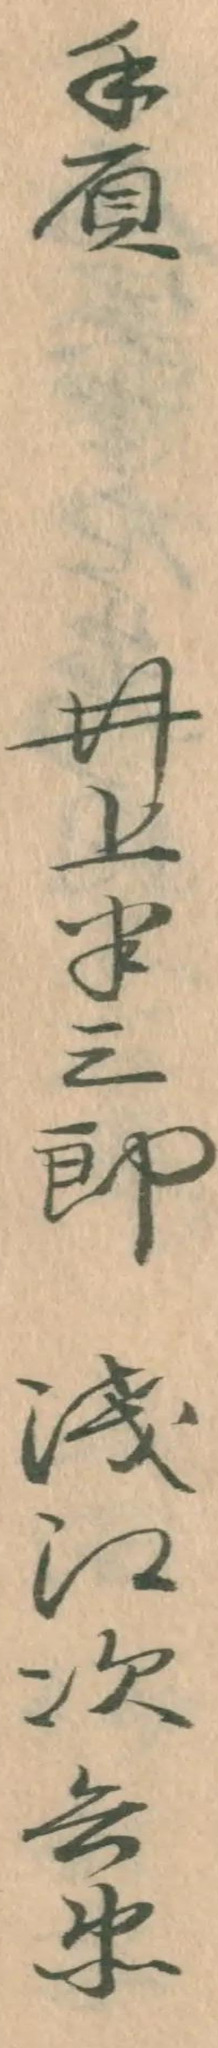手負井上半三郎浅江次兵衛
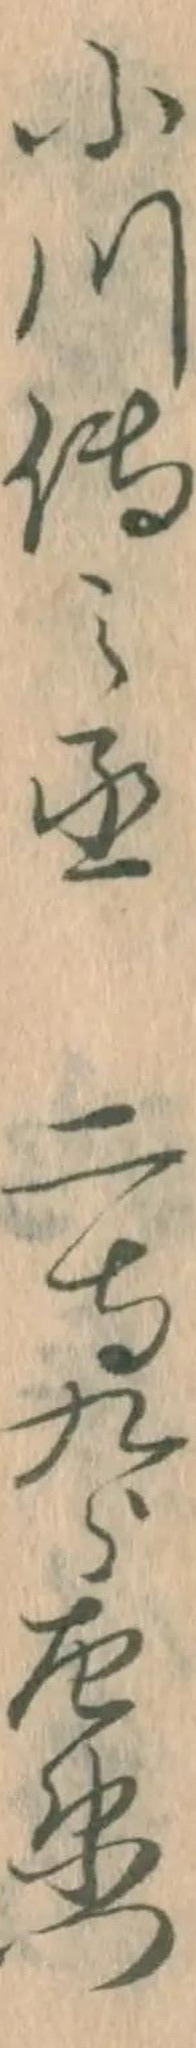小川伝之丞二寺九郎左衛門
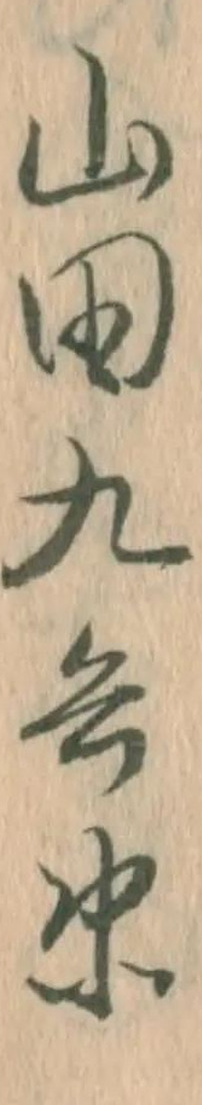松田覚兵衛
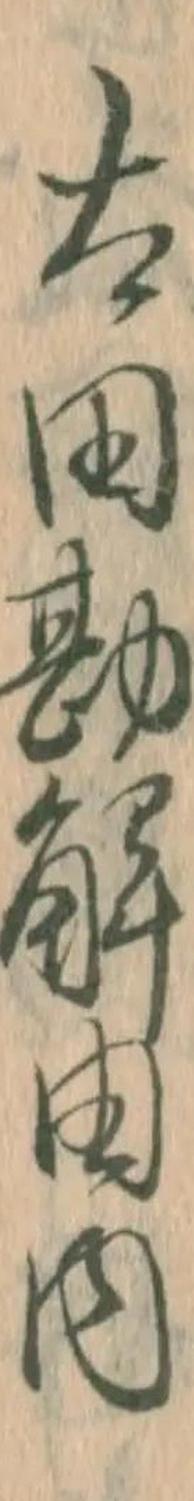太田勘解由内
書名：切支丹御退治記 49巻. [9]
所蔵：国立国会図書館 National Diet Library, JAPAN
